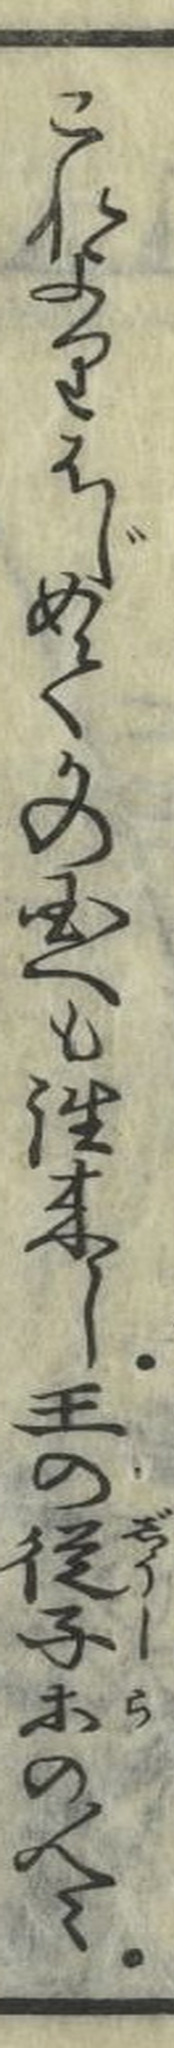これよりはじめてかの国へも往来し・王の従子等の人々・
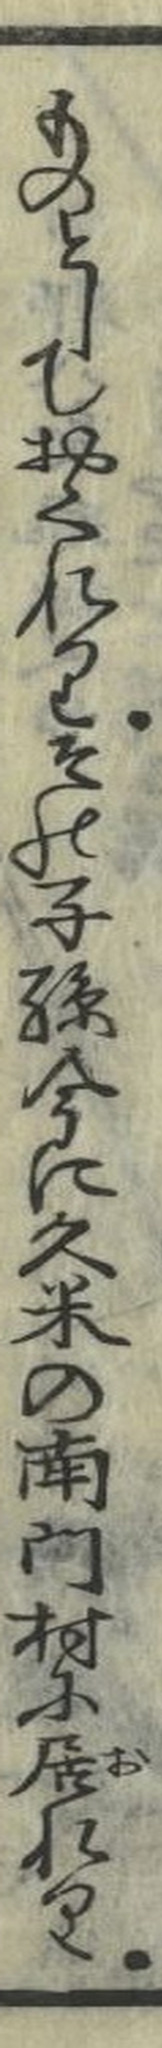ものとしておくれり・その子孫今に久米の南門村に居れり

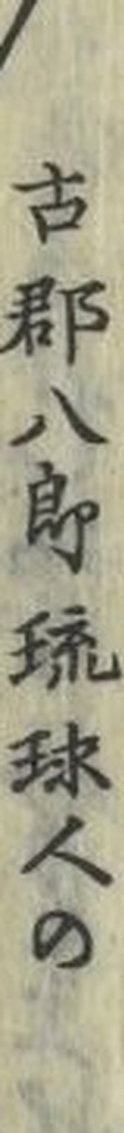古郡八郎琉球人の
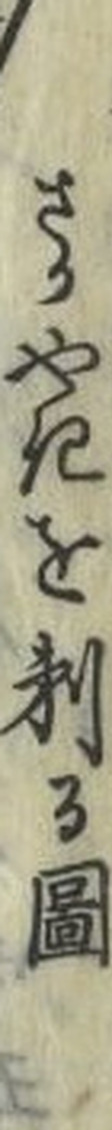さかやきを剃る圖

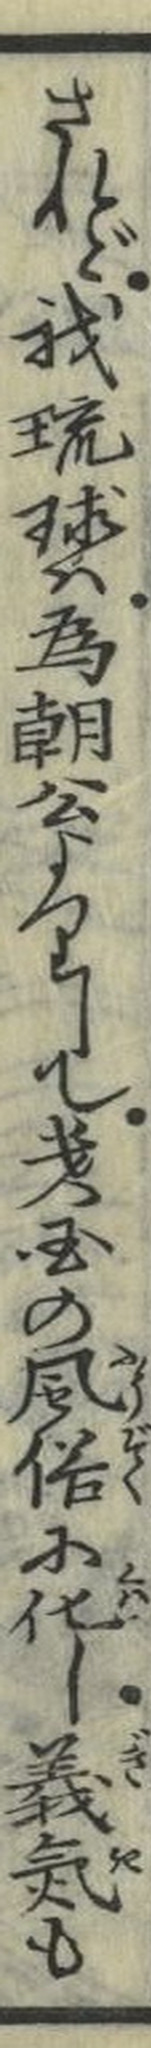されど・我琉球は・爲朝公よりして・貴国の風俗に化し・義𣱛も
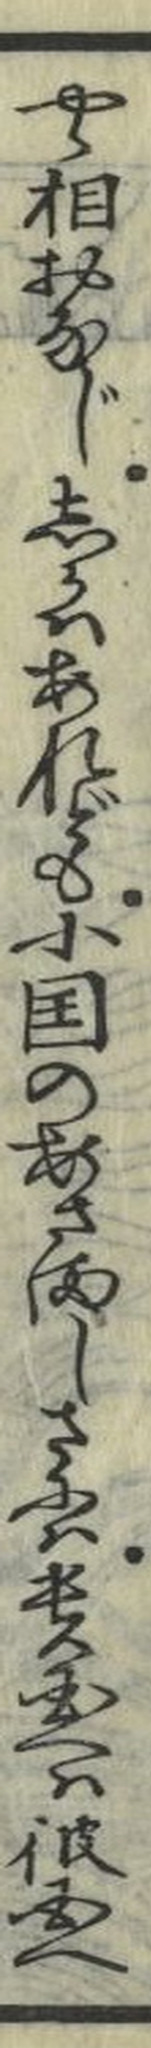やゝ相おなじ・しかはあれども・小国のあさましさには・貴国へは彼国へ
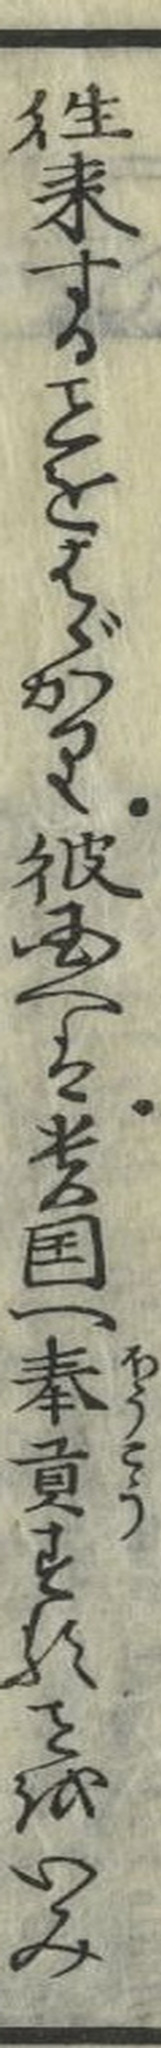往来することをはゞかり・彼国へは・貴国へ奉貢することをいみ
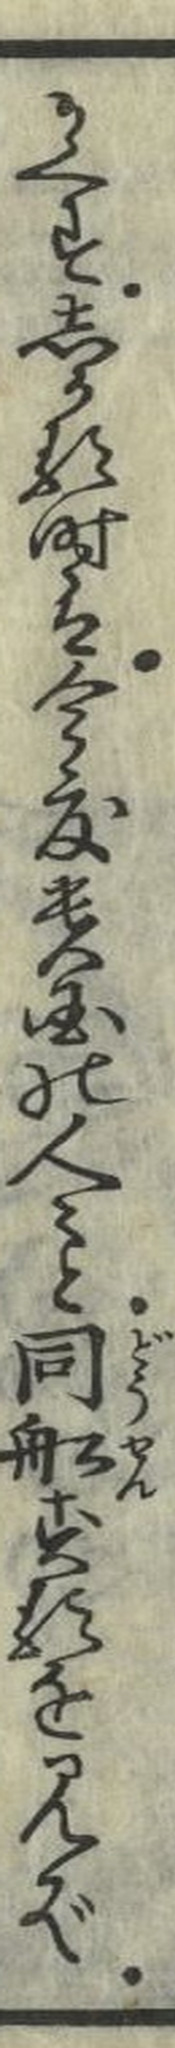かくす・しかる時は・今度貴国の人々と・同船するを見ば・
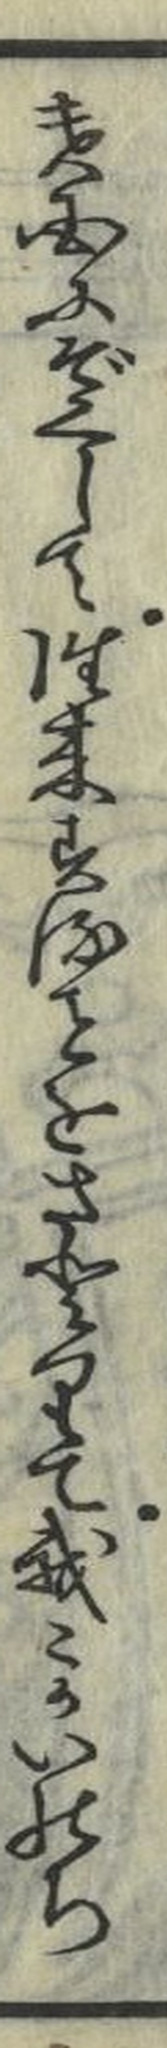貴国にぞくして・往来することをさとりて・我々かいのち
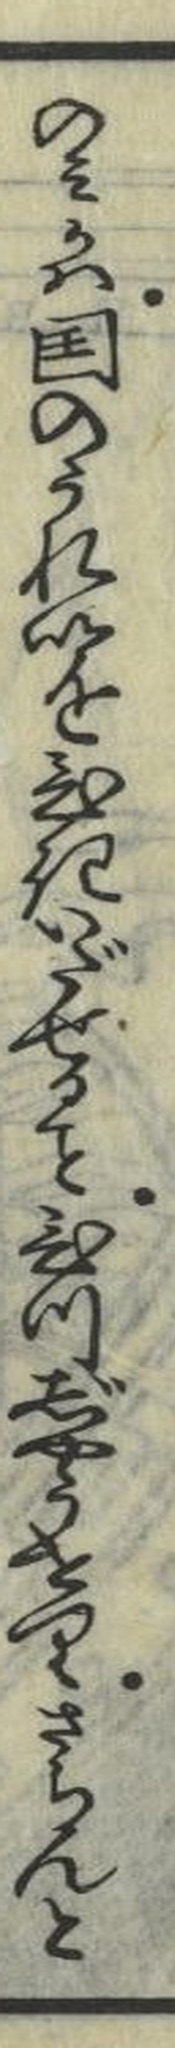のみかは・国のうれいをひきいだせることを・ひつじやうせり・さらんと
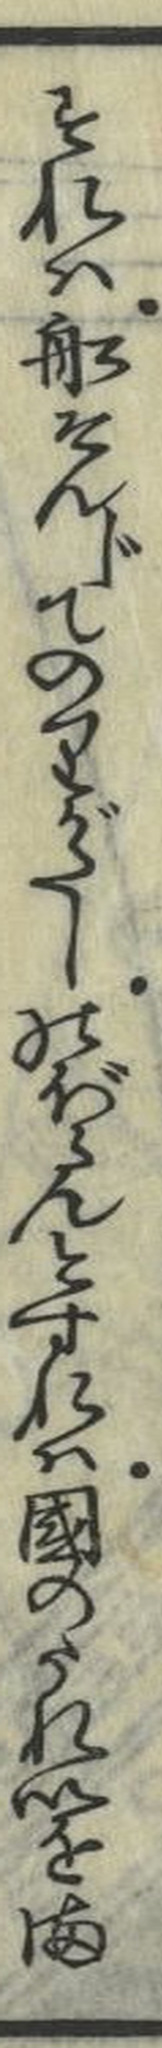すれは・船そんじてのりがたし・のぼらんとすれは・國のうれいをま
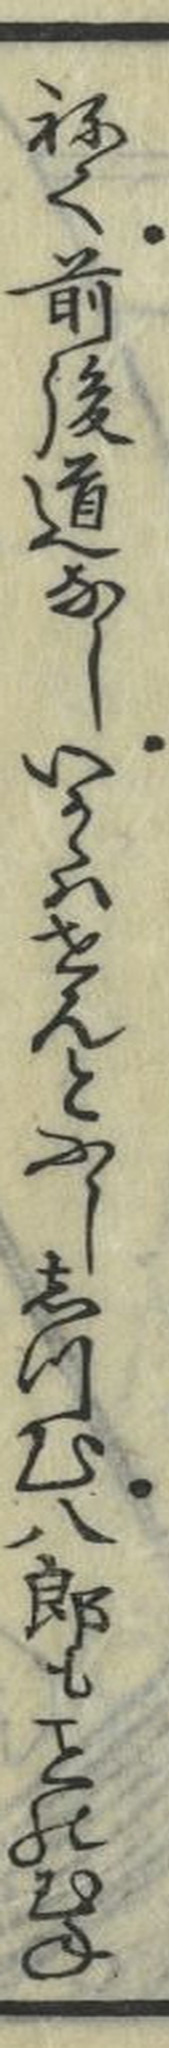ねく・前後道なし・いかゝはせんとなししつむ・八郎もことのむね
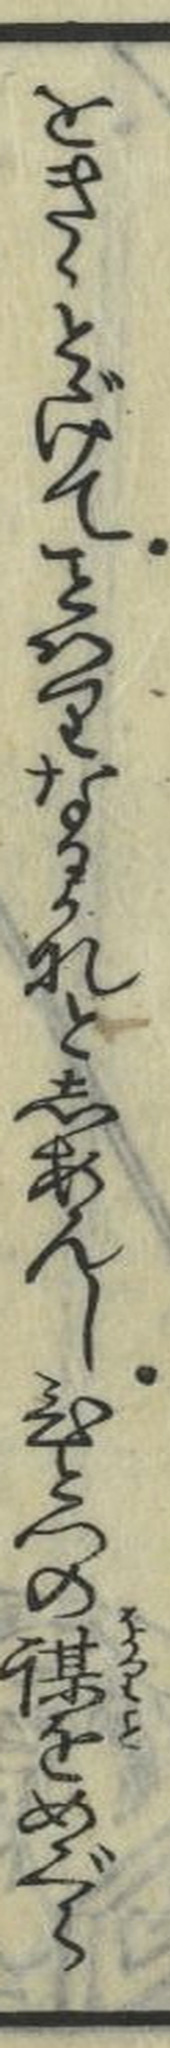をきゝとゞけて。ことはりなるかなとしあんし・ひとつの謀をめぐら
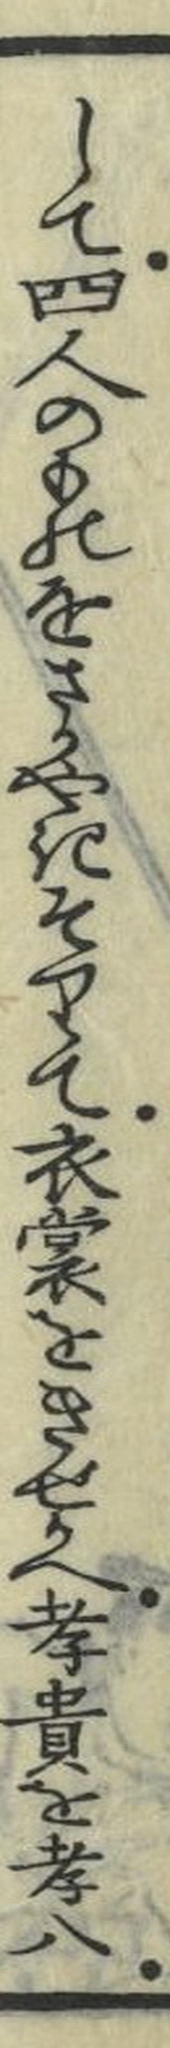して・四人のものをさかやきそりて・衣裳をきせかへ・孝貴を孝八・
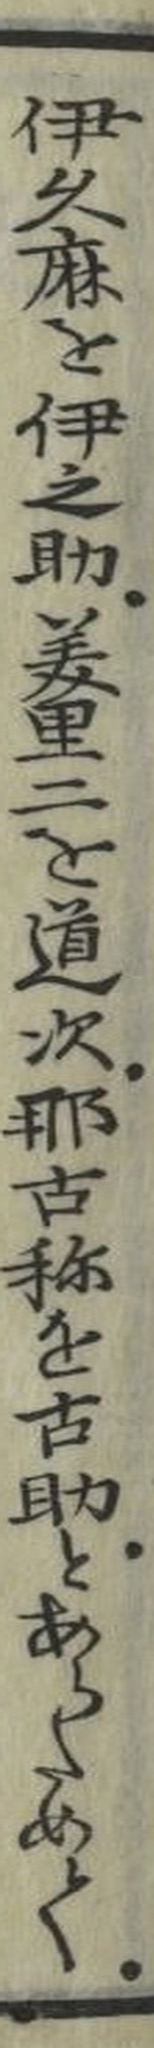伊久麻を伊之助・美里二を道次・耶古称を古助と・あらためて・
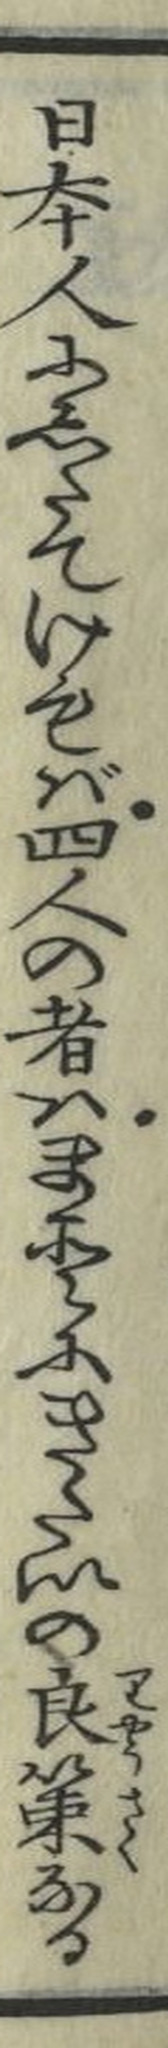日本人にしたてければ・四人の者は・まことにきたいの良策なる
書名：琉球秊代記 附雑話 全
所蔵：University of the Ryukyus Library
